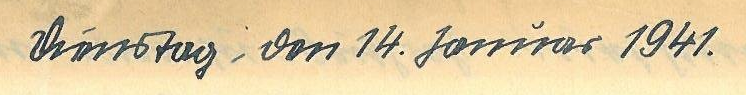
Dienstag, den 14. Januar 1941.
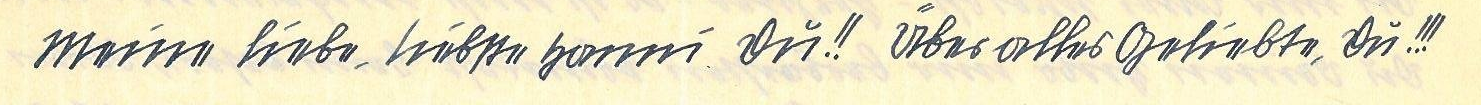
Meine liebe, liebste Du!! Über alles Geliebte, Du!!
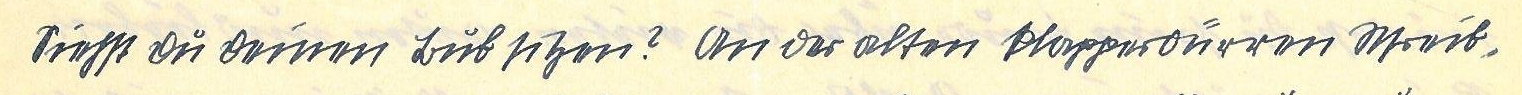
Siehst Du Deinen Bub sitzen? An der alten klapperdürren Schreib¬
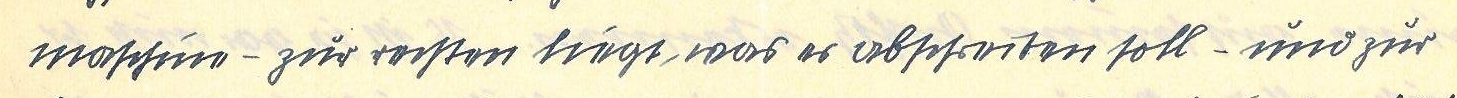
maschine – zur rechten liegt, was er abschreiben soll – und zur
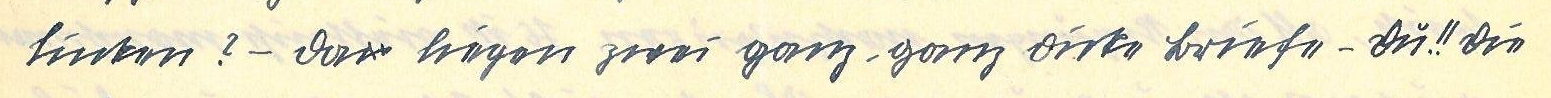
linken? – dar liegen zwei ganz, ganz dicke Briefe – Du!! Die
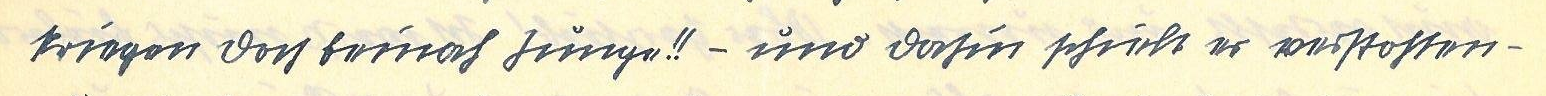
kriegen doch beinah Junge!! – und dahin schielt er verstohlen –
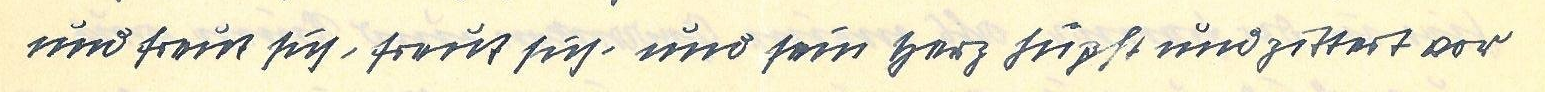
und freut sich, freut sich, und sein Herz hüpft und zittert vor
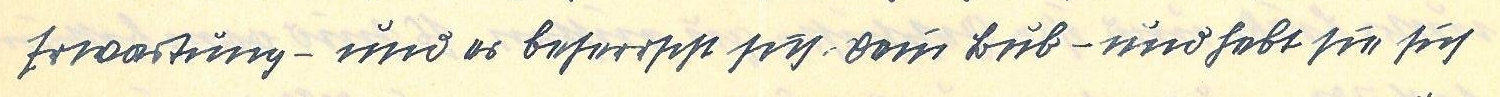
Erwartung – und er beherrscht sich, Dein Bub – und hebt sie sich
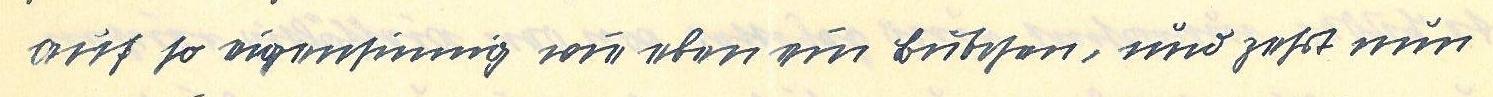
auf so eigensinnig wie eben ein Bübchen, und zehrt nun
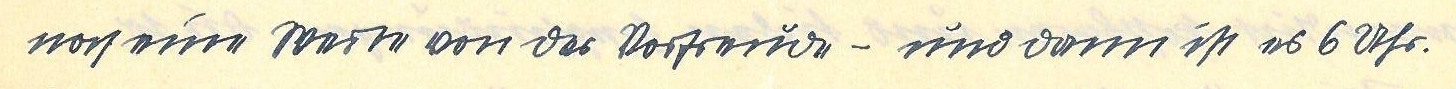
noch eine Weile von der Vorfreude – und dann ist es 6 Uhr.
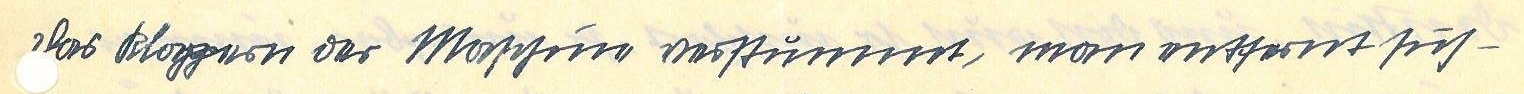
Das Klappern der Maschine verstummt, man entfernt sich –
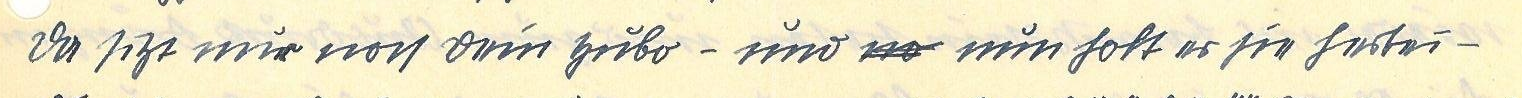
Da sitzt nur noch Dein Hubo – und no nun holt er sich sie herbei –
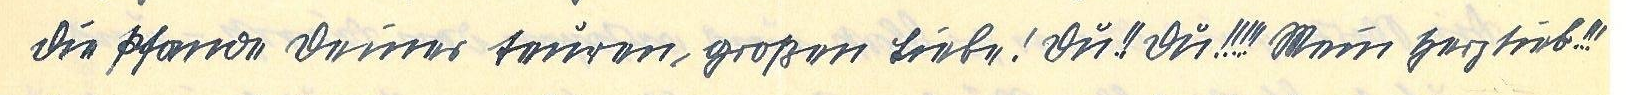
die Pfande Deiner teuren, großen Liebe! Du!! Du!!!!! Mein Herzlieb!!!
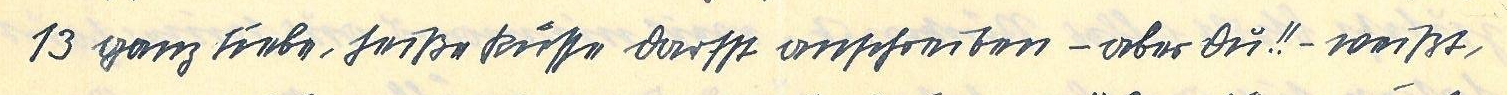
13 ganz liebe, heiße Küsse darfst ausschreiben – aber Du!! – weißt,
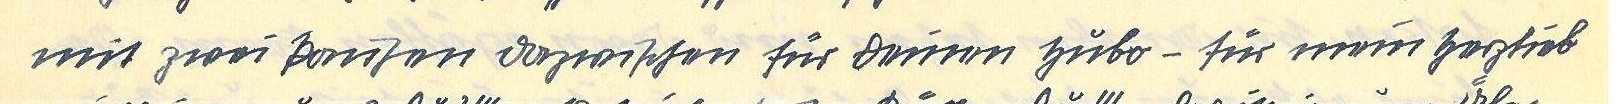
mit zwei Pausen dazwischen für Deinen Hubo – für mein Herzlieb
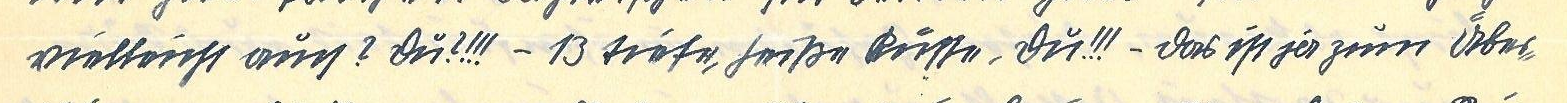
vielleicht auch? Du?!!! – 13 tiefe, heiße Küsse, Du!!! – das ist ja zum Über¬
